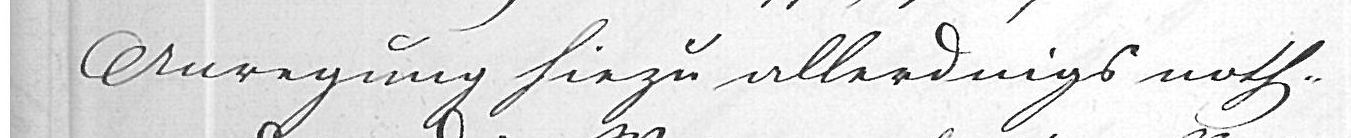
Anregung hiezu allerdings noth-
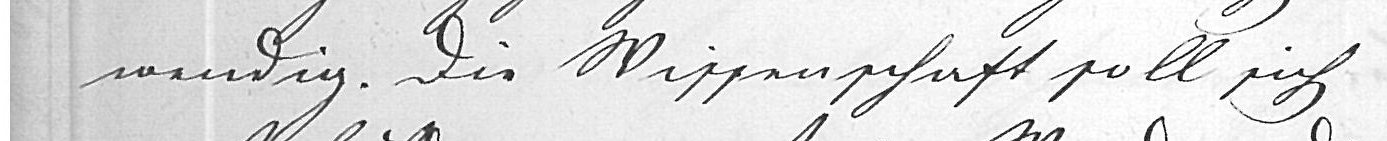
wendig. Die Wissenschaft soll sich
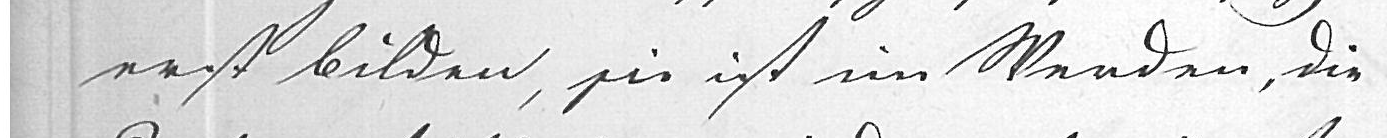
erst bilden, sie ist im Werden, die
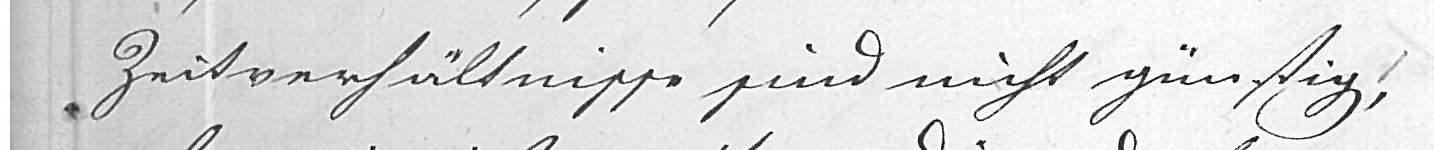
Zeitverhältnisse sind nicht günstig,
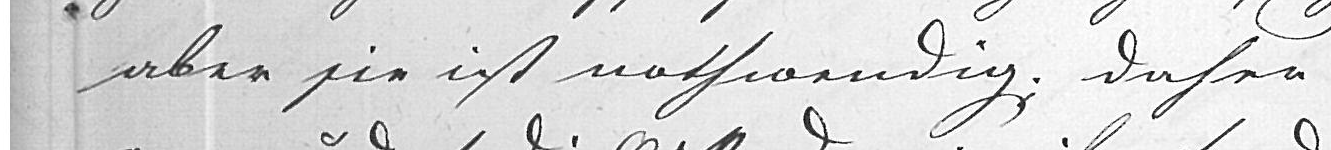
aber sie ist nothwendig; daher
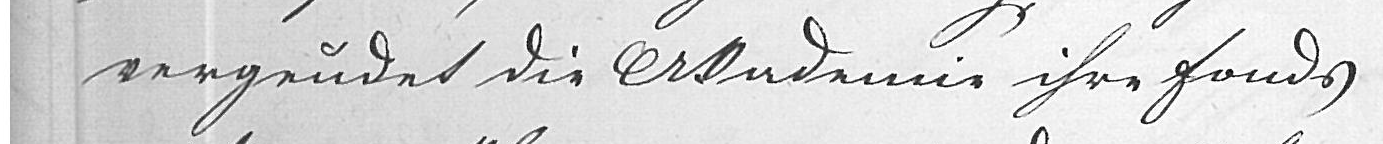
vergeudet die Akademie ihre Fonde
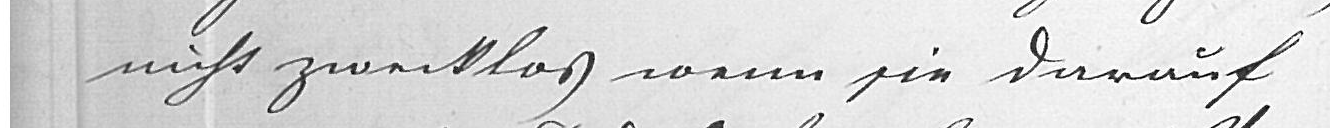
nicht zwecklos wenn sie darauf
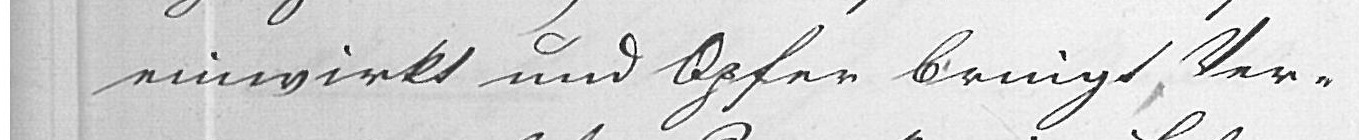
einwirkt und Opfer bringt Ver-
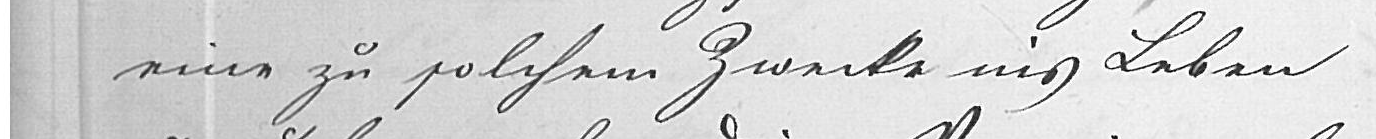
eine zu solchem Zwecke ins Leben
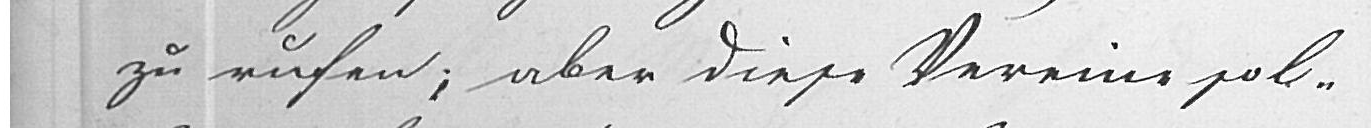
zu rufen; aber diese Vereine sol-
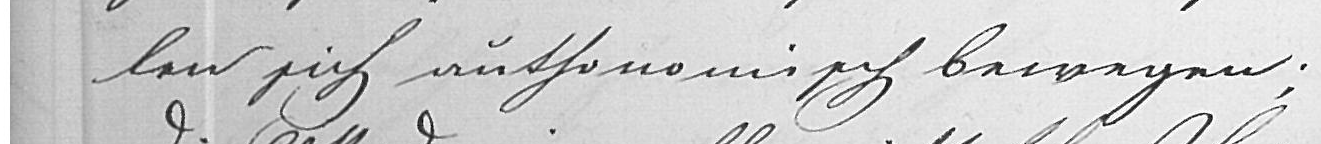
len sich authonomisch bewegen;
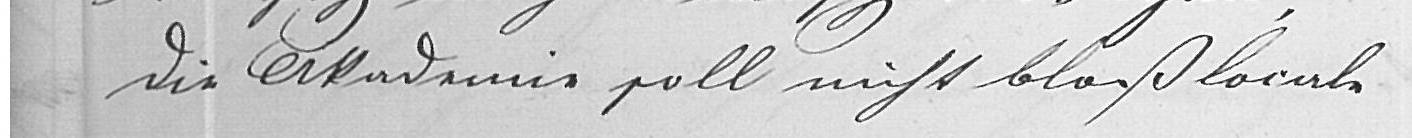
Die Akademie soll nicht bloß Local-
